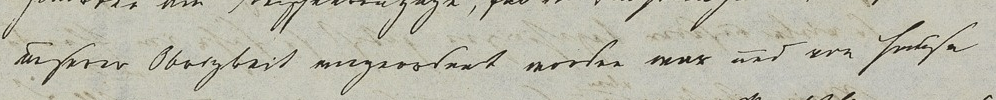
unserer Obrigkeit angeordnet worden war und von Hause
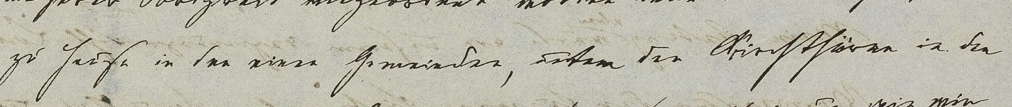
zu Hause in den einen Gemeinden, unter den Kirchthüren in den
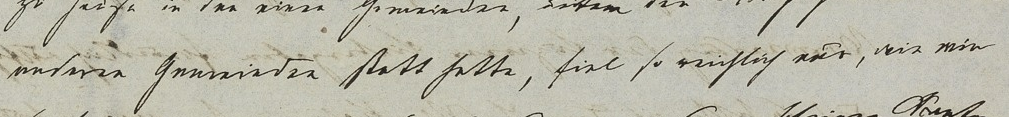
anderen Gemeinden statt hatte, fiel so reichlich aus, wie wir
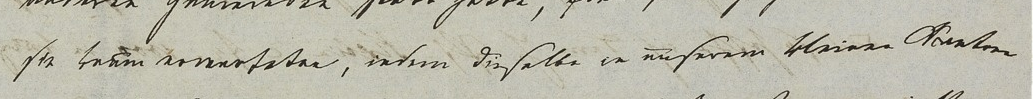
sie kaum erwarteten, indem dieselbe in unserem kleinen Kantone
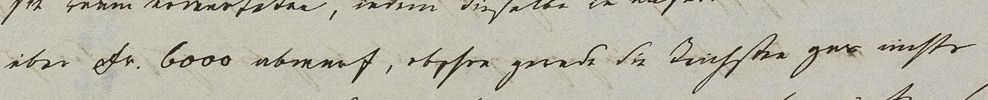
über Fr. 6000 abwarf, obschon gerade die Reichsten gar nichts
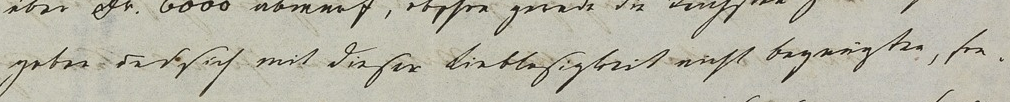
gaben und sich mit dieser Lieblosigkeit nicht begnügten, son-
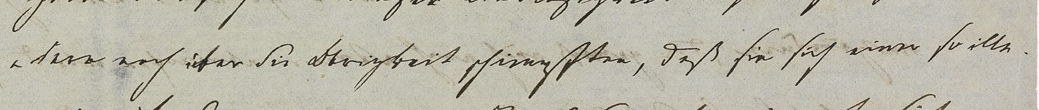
dern noch über die Obrigkeit schimpften, daß sie sich einer so ille-
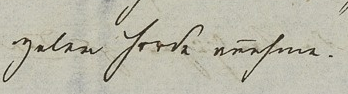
galen Horde annehme. –
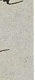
Bald
